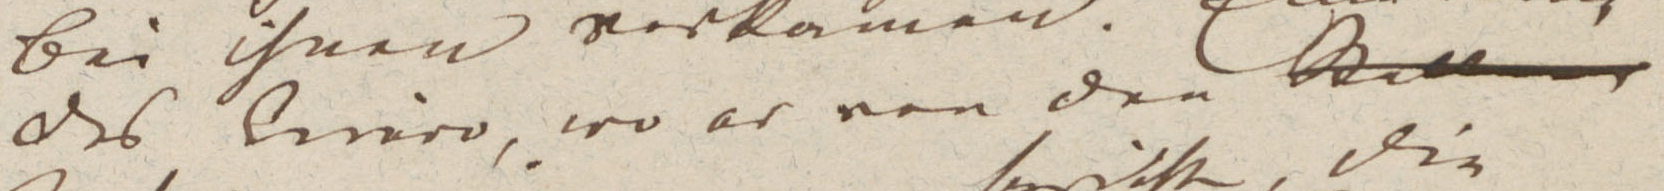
des Cicero, wo er von den Stellen
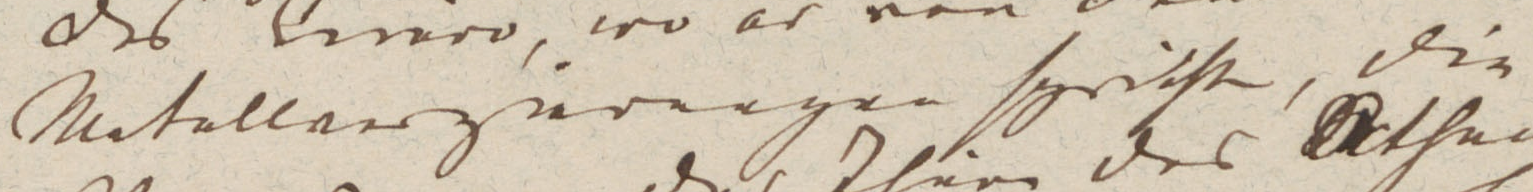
Metallverzierungen spricht, die
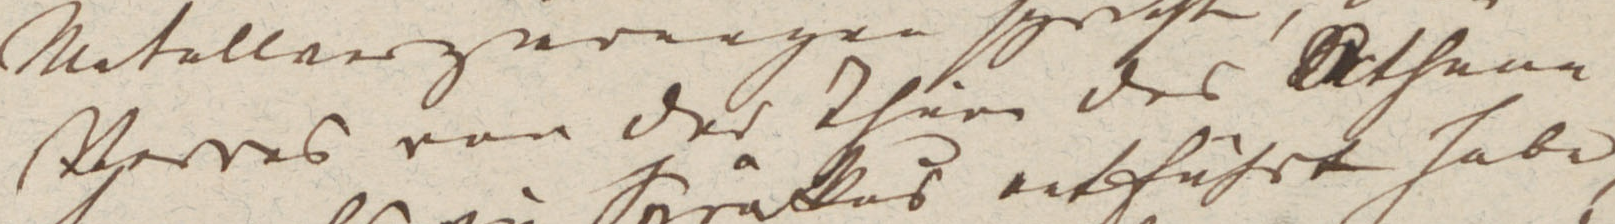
Verres von der Thüre des StAthene-
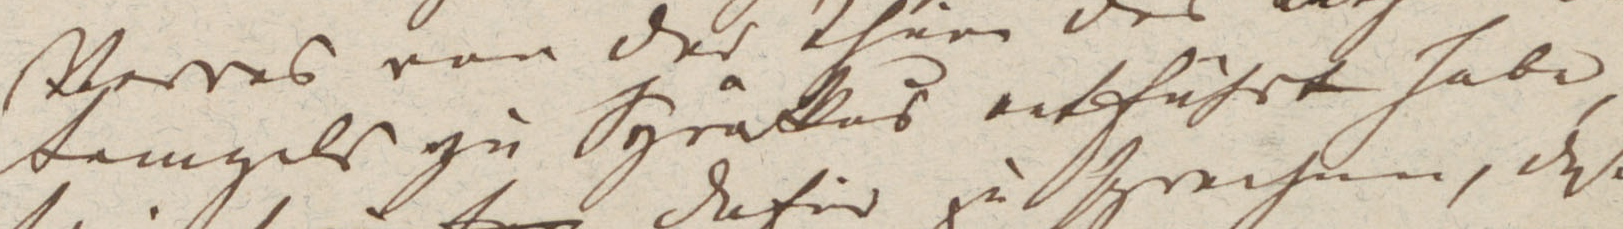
tempels zu Syrakus entführt habe,
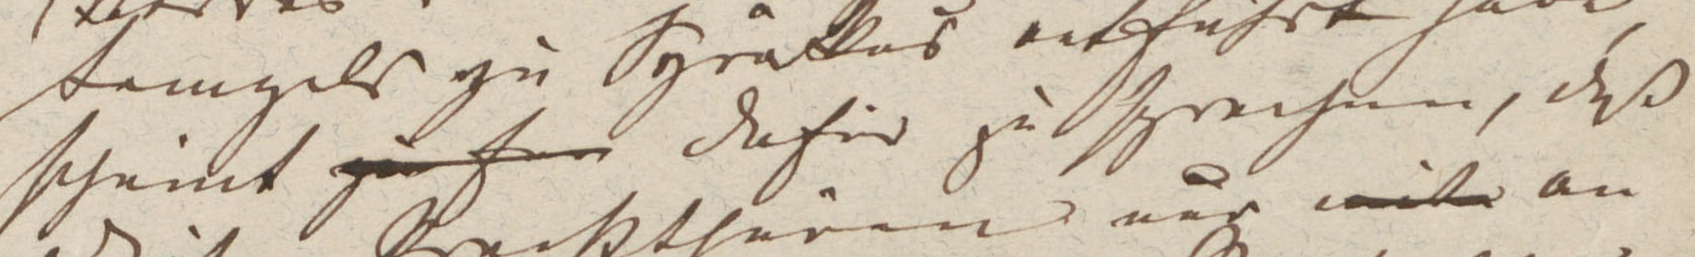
scheint zu f dafür zu sprechen, dass
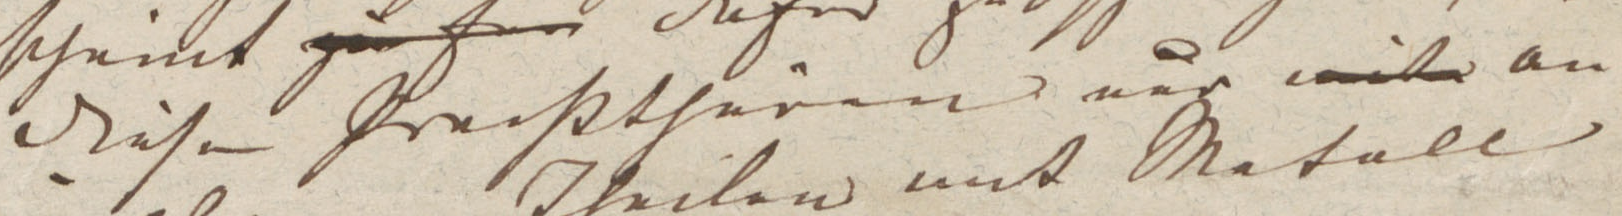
diese Prachtthüren nur mit an
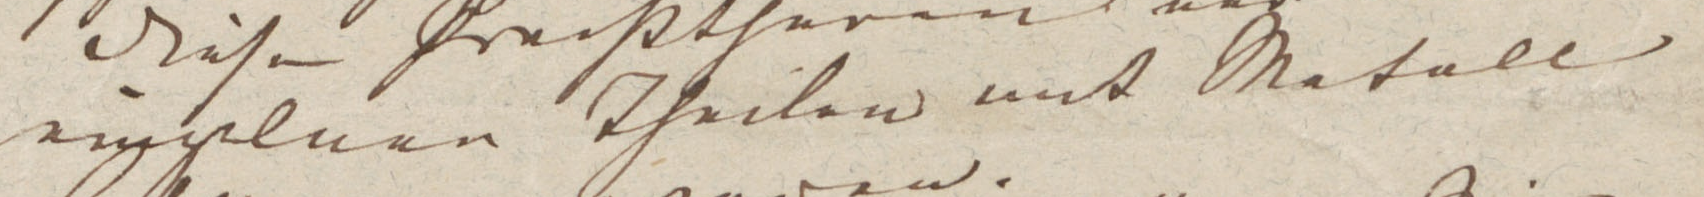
einzelnen Theilen mit Metall
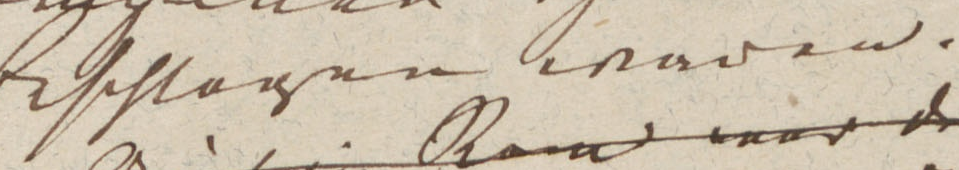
beschlagen waren.
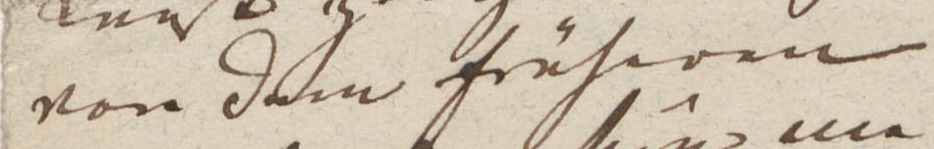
von dem früheren
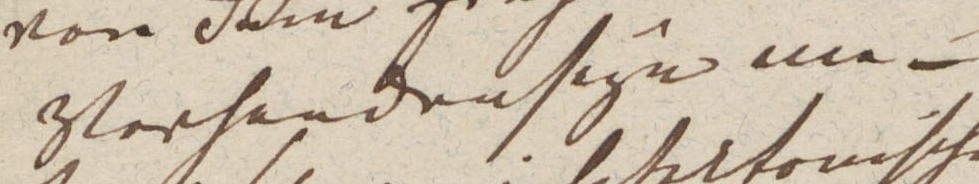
Vorhandenseyn me-
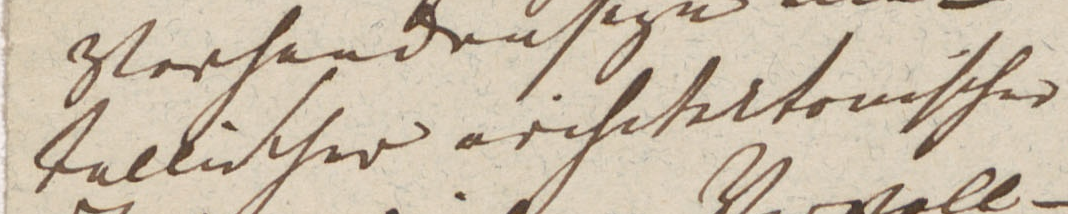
tallischer architectonischer
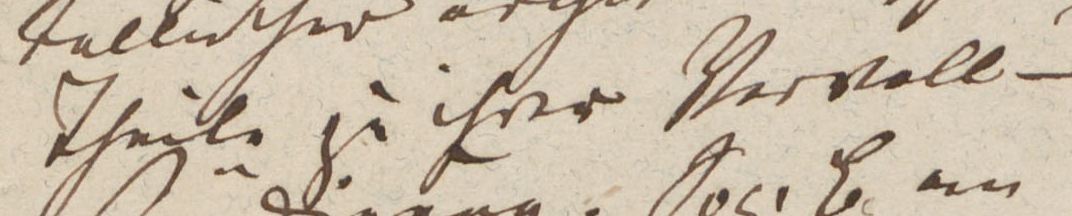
Theile zu ihrer Vervoll-
